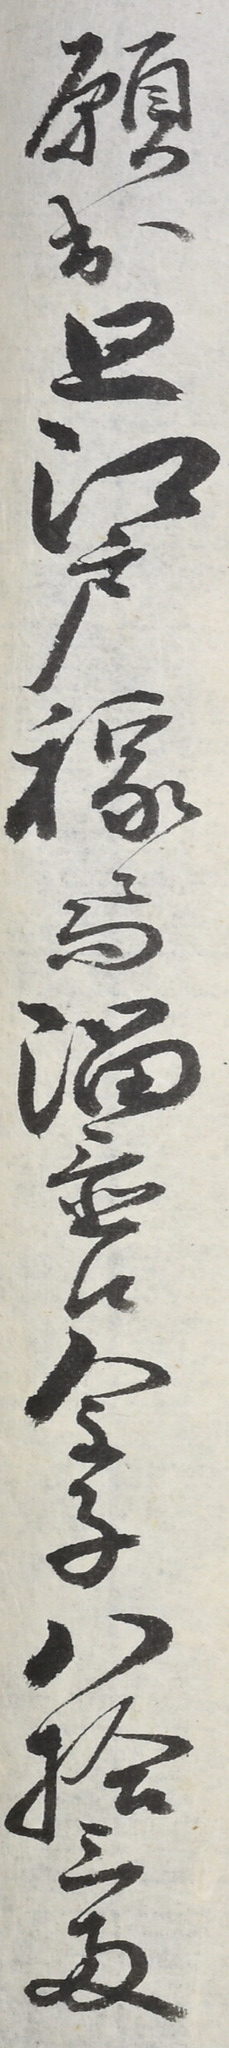願出且江戸稼ニ而溜置候金子八拾三両
